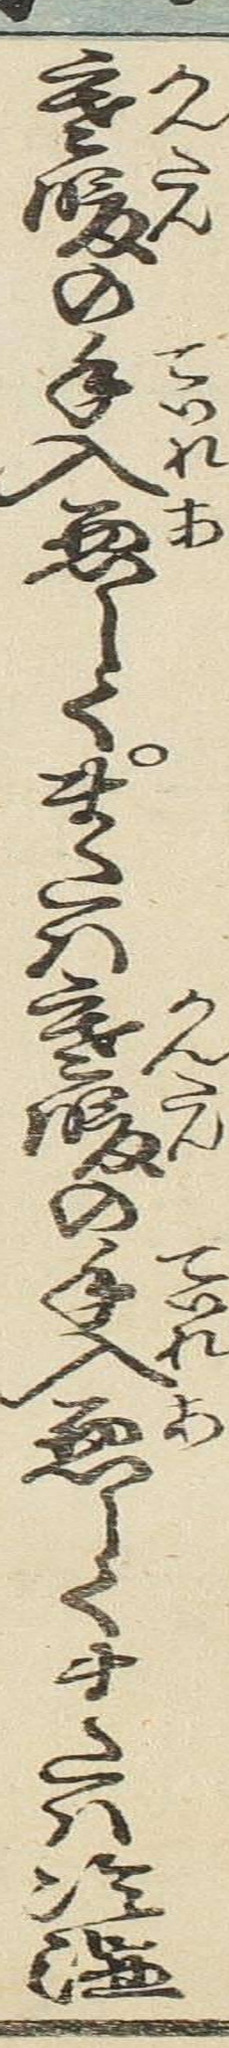寒暖の手入悪しく。または寒暖の手入悪しくまたは冷湿
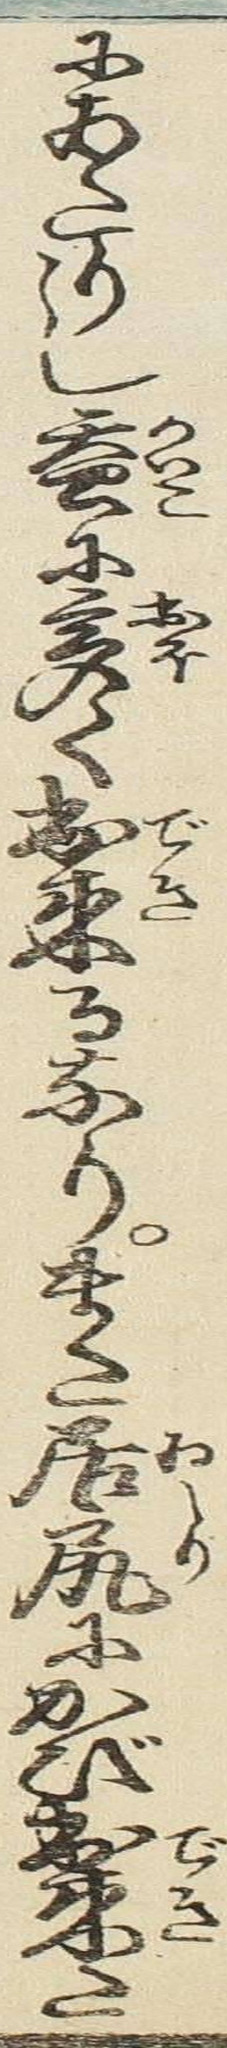にあたりし蚕に多く出来るなり。また居尻にかび出来た
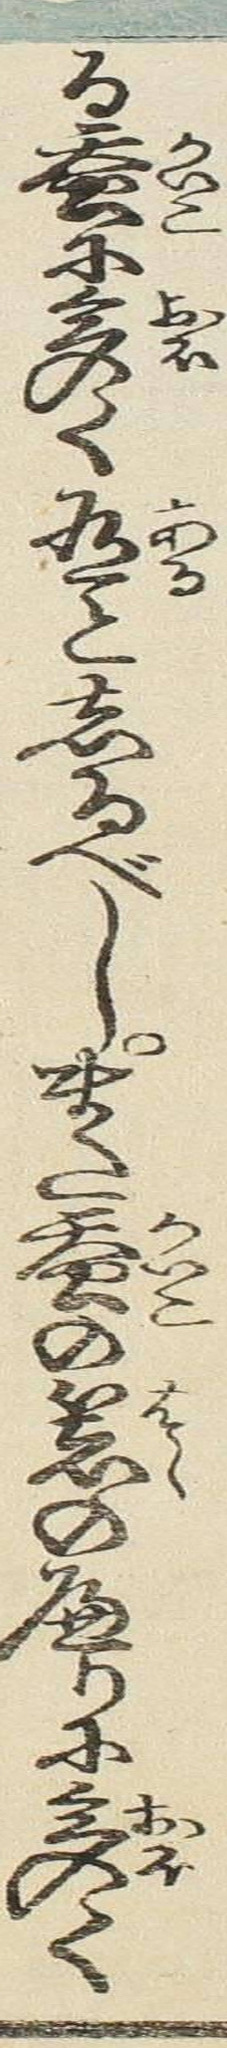る蚕に多く有としるべし。また蚕の箸のへりに多く
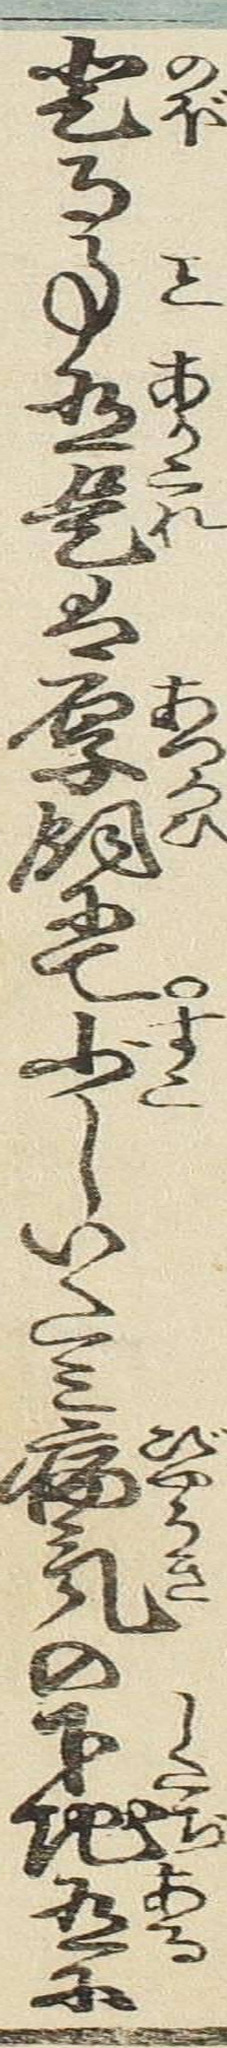登る事有是は厚飼にて。少しいたみ病気の下地有に
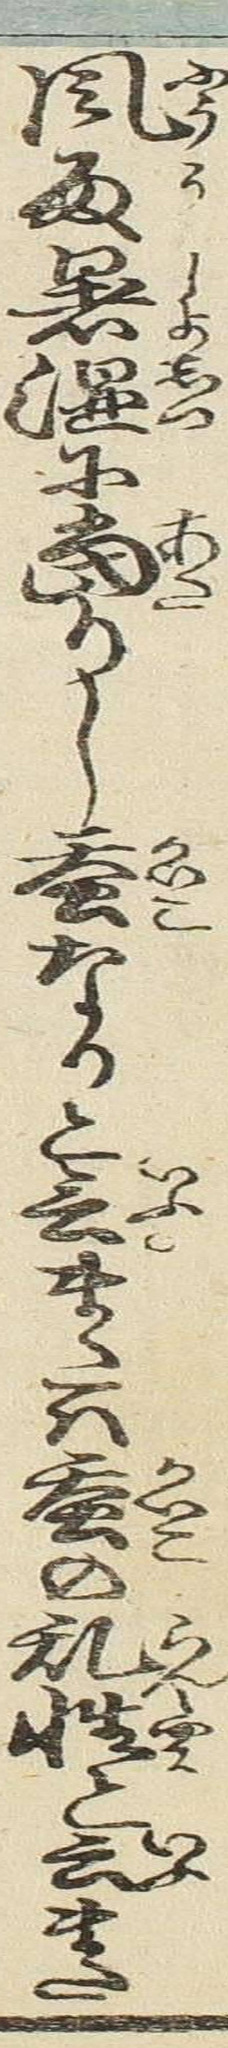風雨暑湿に当りし蚕なりと言。または蚕の乱性と言また
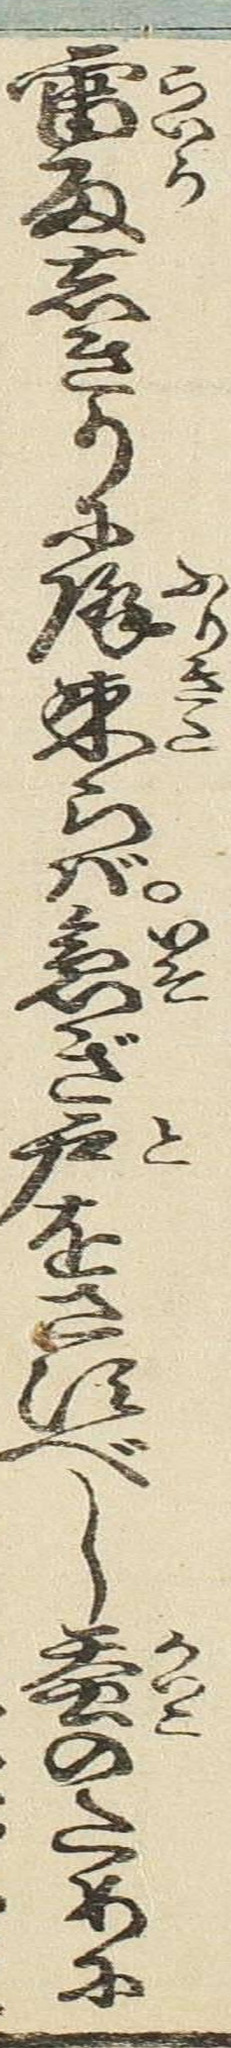雷雨しきりに降来らば。急ぎ戸をさすべし蚕のために
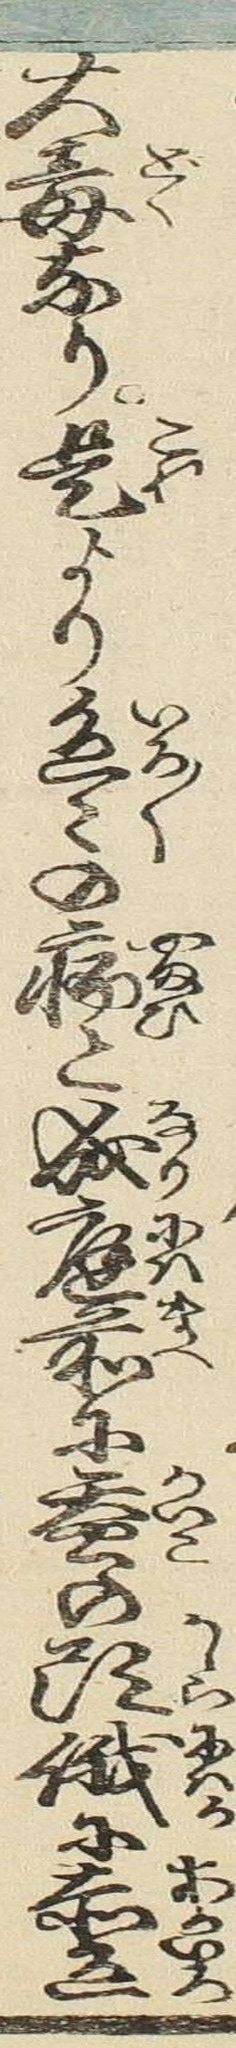大毒なり。是より色々の病と成庭前に蚕の頭俄に赤色
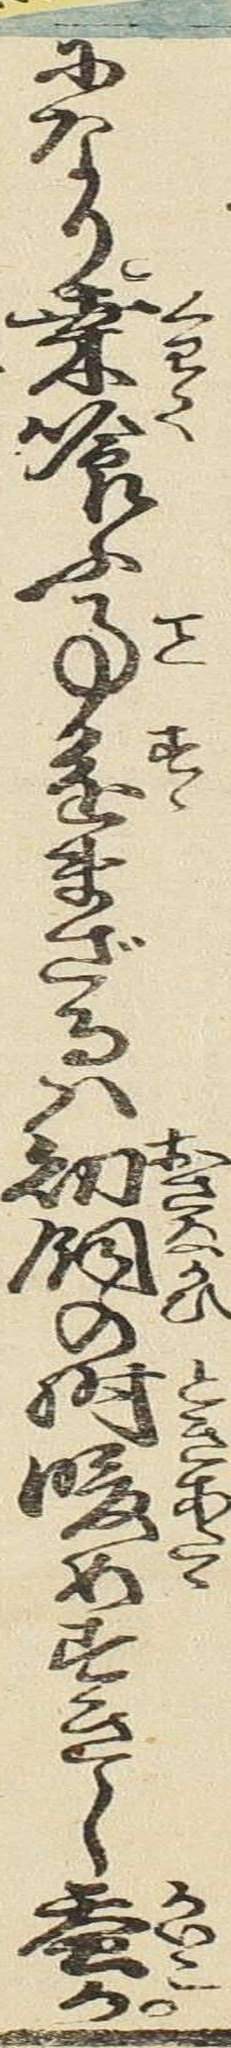になり。桑喰ふ事進まざるは初飼の時暖めすきし蚕か。
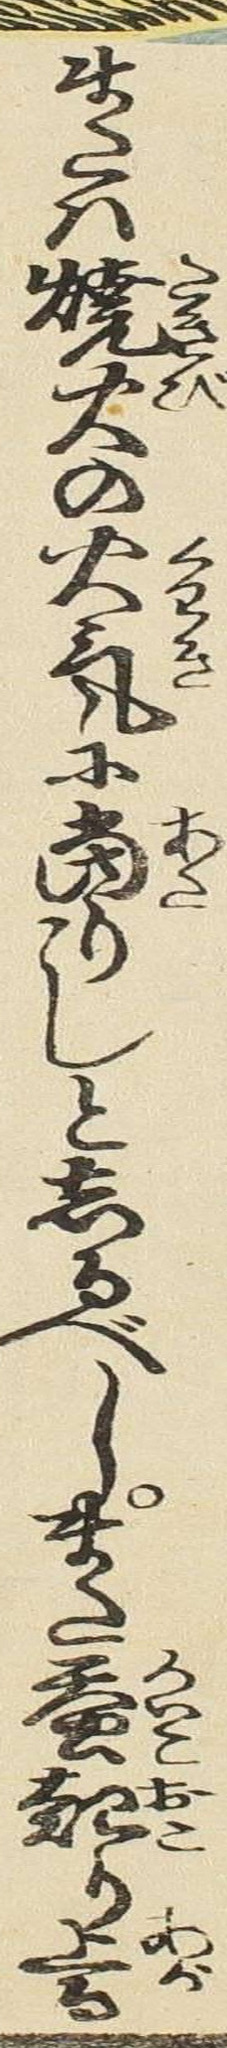または焼火の火気に当りしとしるべし。また蚕起り上る
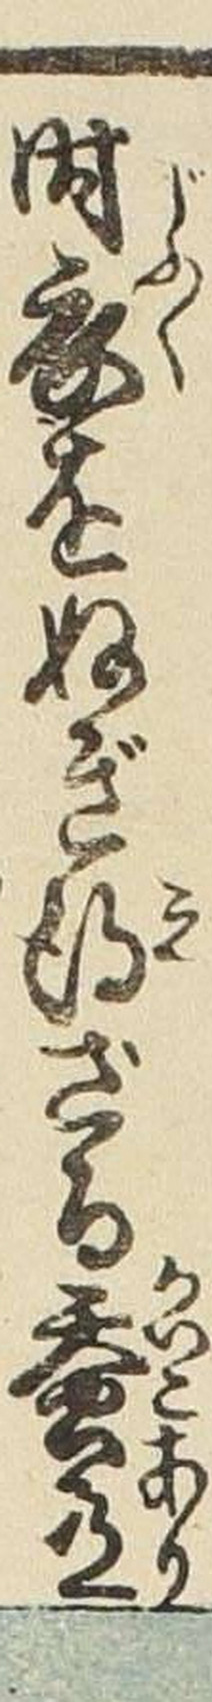時衣をぬぎ得ざる蚕有
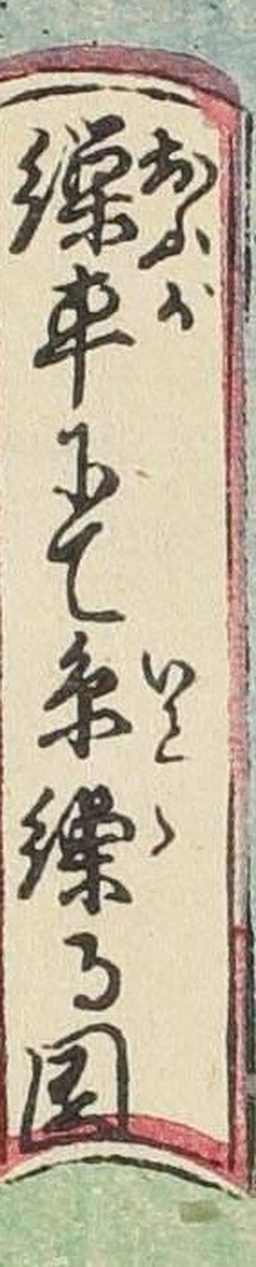繰車にて糸繰る図
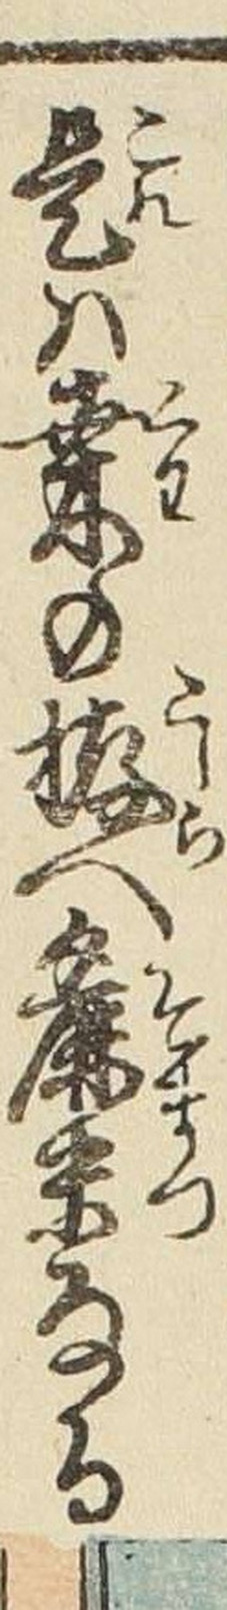是は桑の拵へ麁末なる
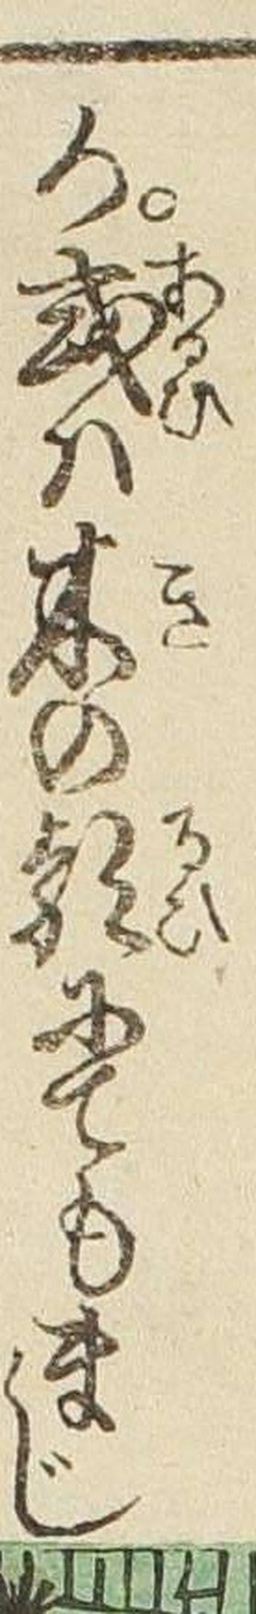か。或は木の類にてもまじ
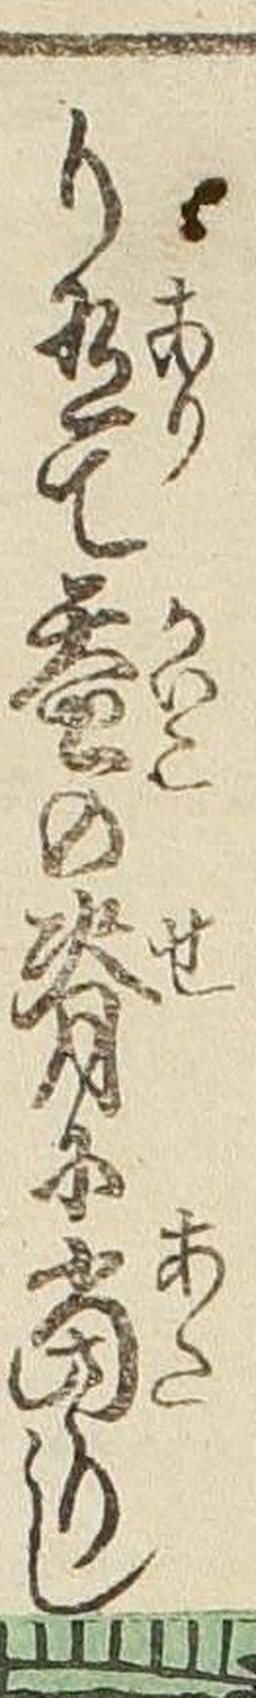り有て蚕の脊に当りし
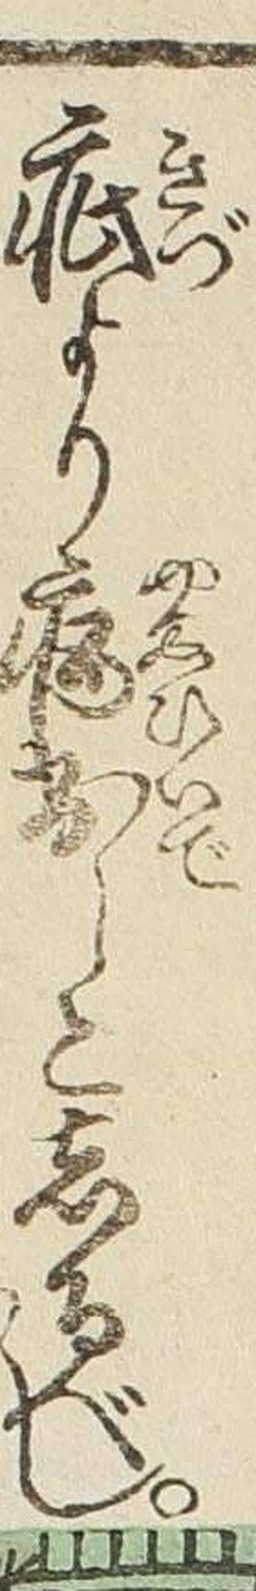疵より病出しとしるべし。
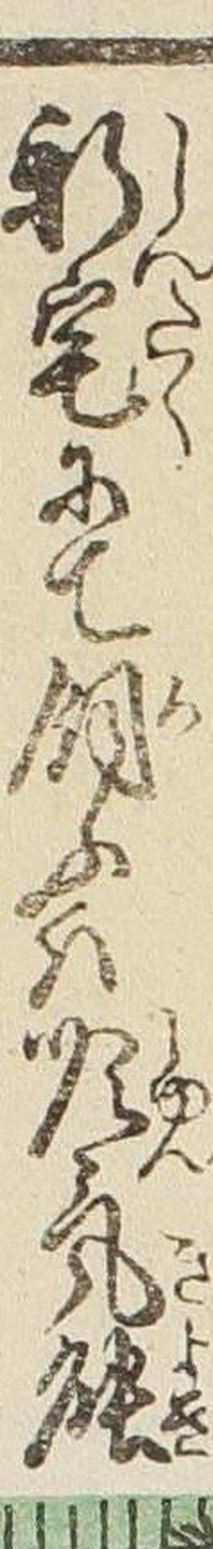新宅にて飼ふは順気能
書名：養蠶圖解
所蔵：東京大学農学生命科学図書館 国文学研究資料館
